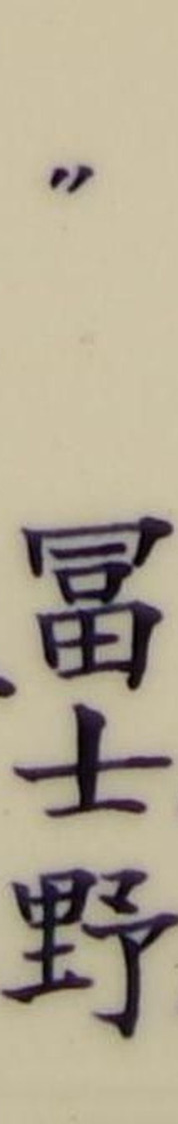冨士野
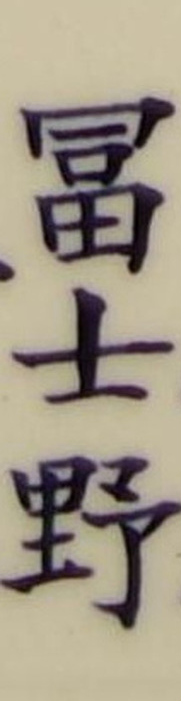冨士野
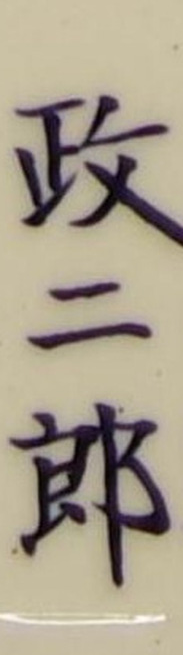政二郎
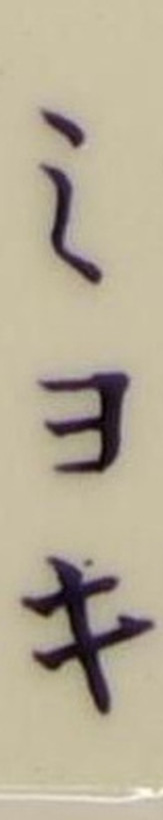ミヨキ
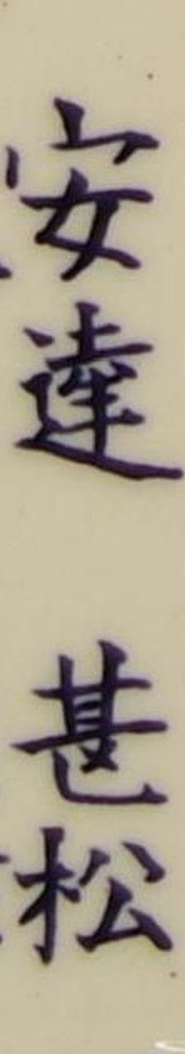安達甚松
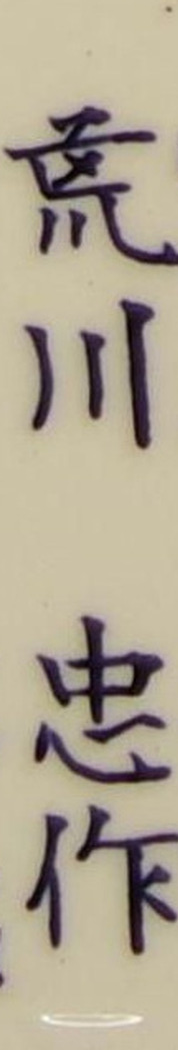荒川忠作
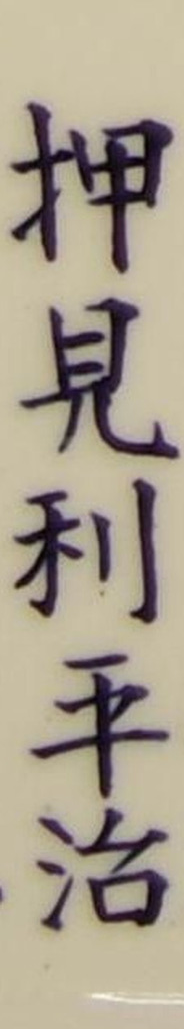押見利平治
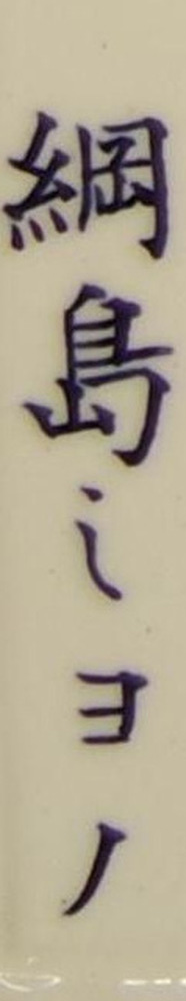網島之ヨノ

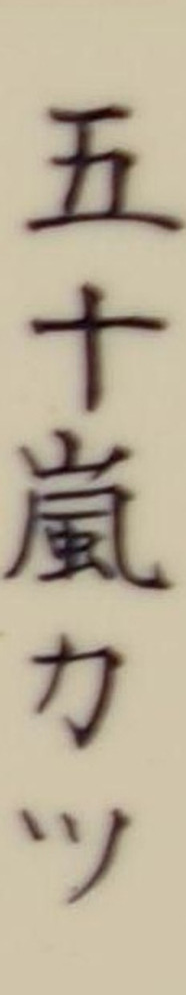五十嵐カツ
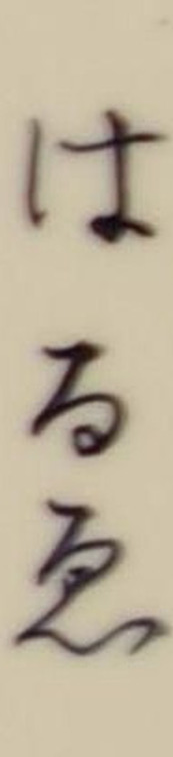はるえ
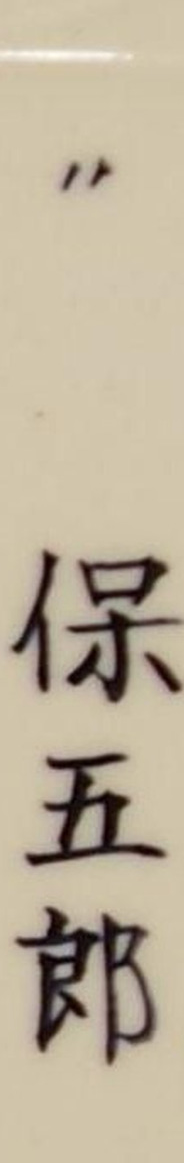保五郎
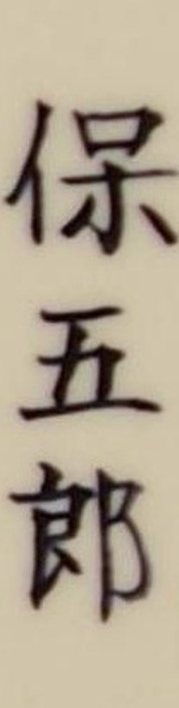保五郎
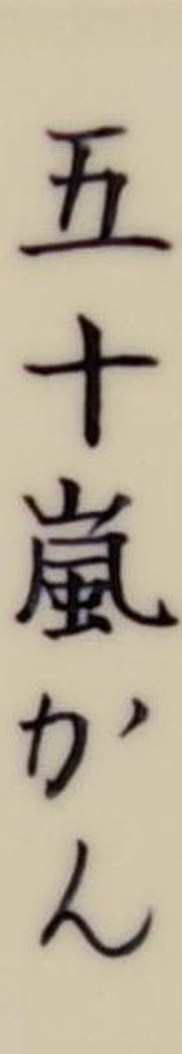五十嵐かん
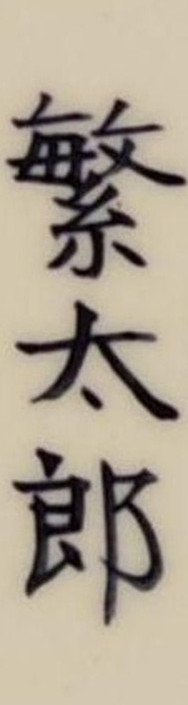繁太郎
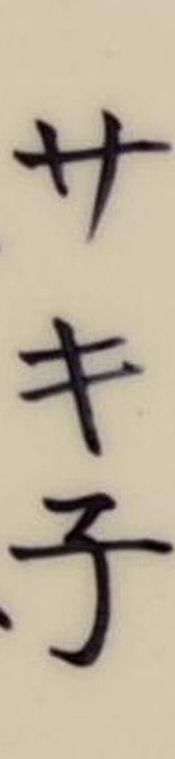サキ子
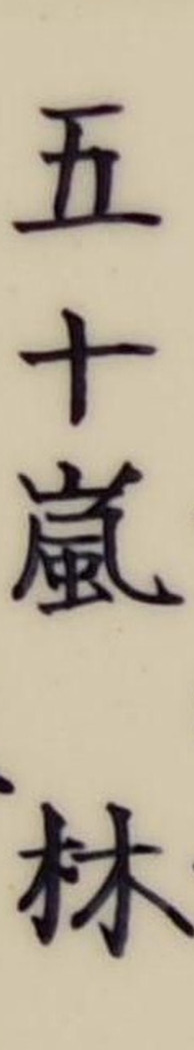五十嵐林
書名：E~L
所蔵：高野山金剛峯寺
